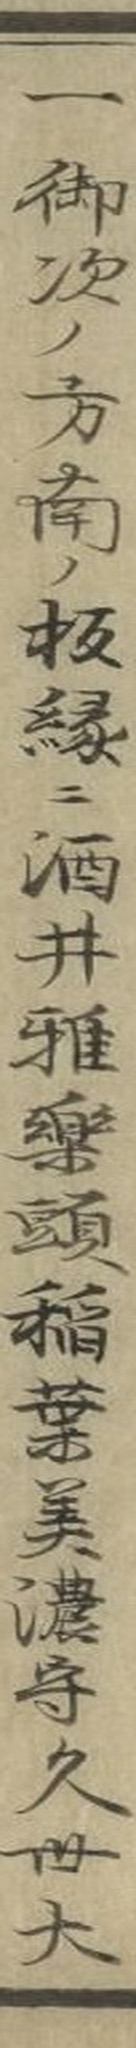一御次ノ方南ノ板縁ニ酒井雅楽頭稲葉美濃守久世大
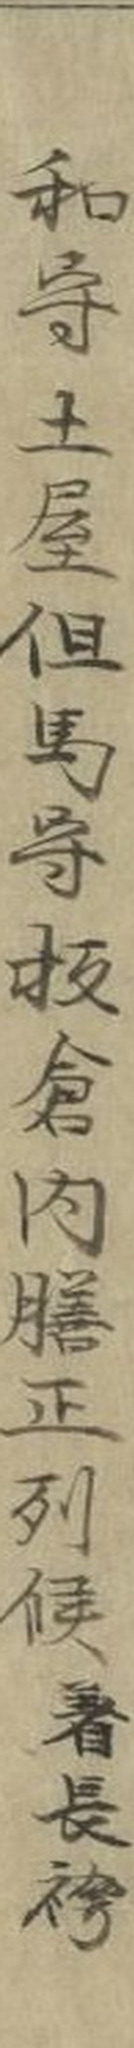和守土屋但馬守板倉内膳正列候着長袴
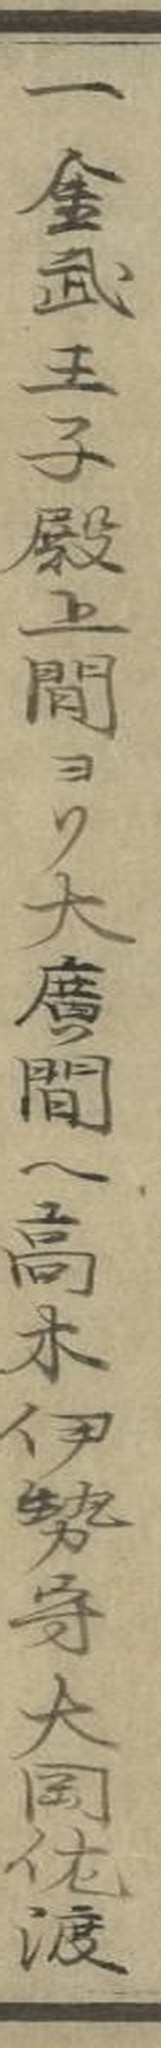一金武王子殿上間ョㇼ大広間へ高木伊勢守大岡佐渡
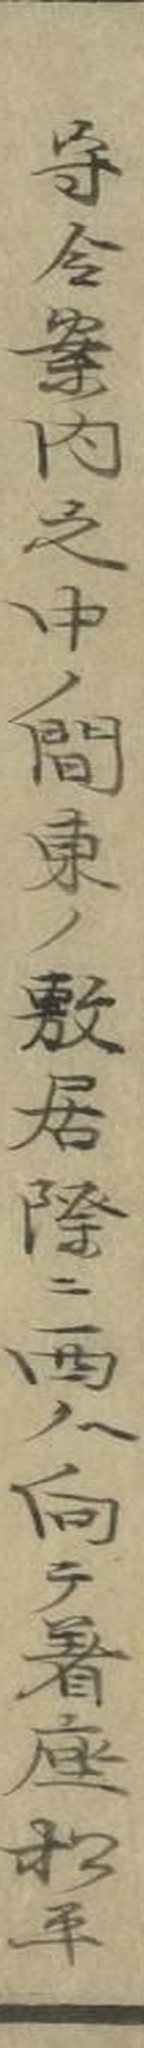守令案内之中ノ間東ノ敷居際ニ西へ向テ着座松平
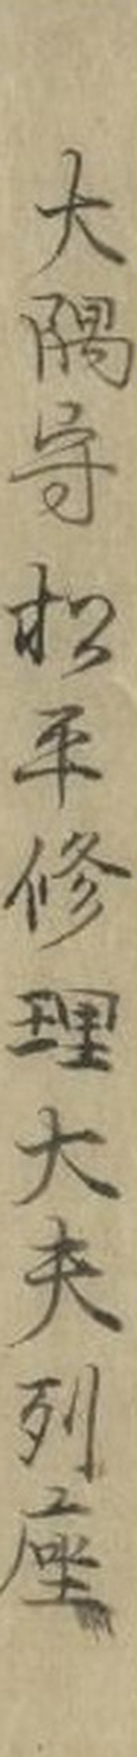大隅守松平修理大夫列座
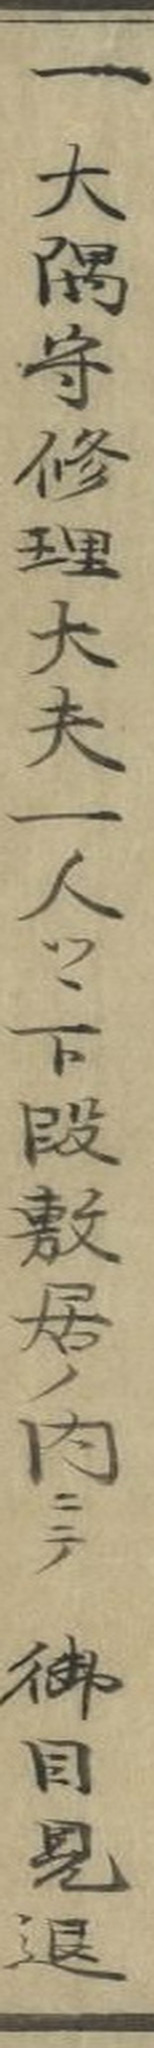一大隅守修理大夫一人ツヽ下段敷居ノ内ニテ御目見退
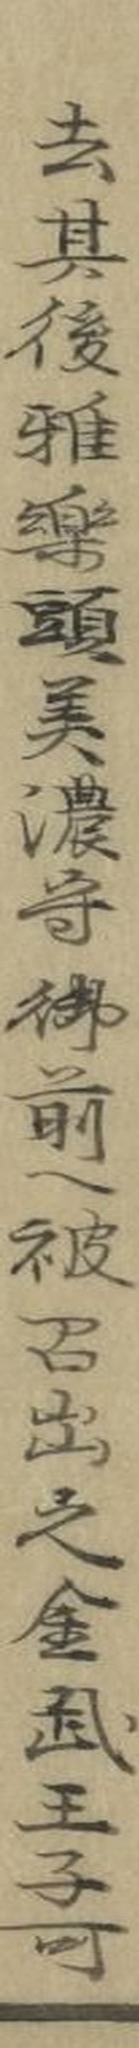去其後雅楽頭美濃守御前へ被召出之金武王子可
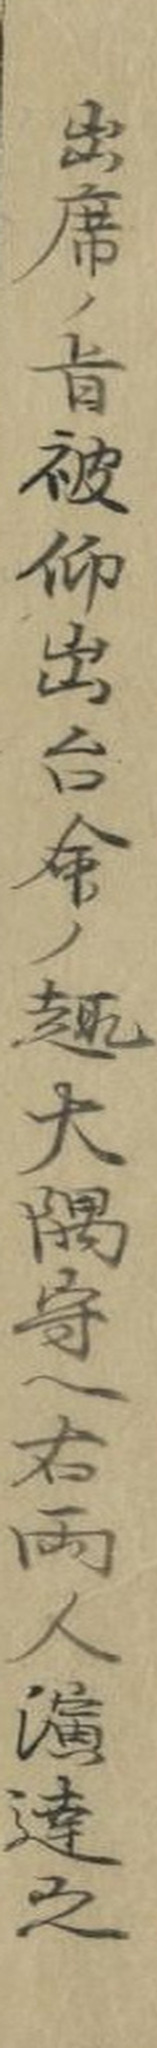出席ノ旨被仰出台命ノ趣大隅守へ右両人演達之
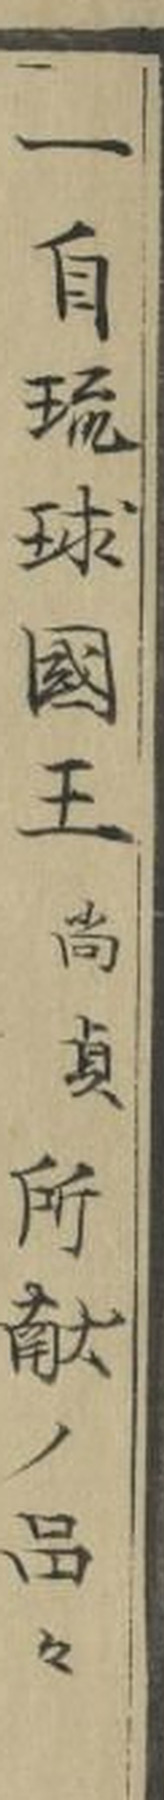一自琉球国王尚貞所献ノ品々
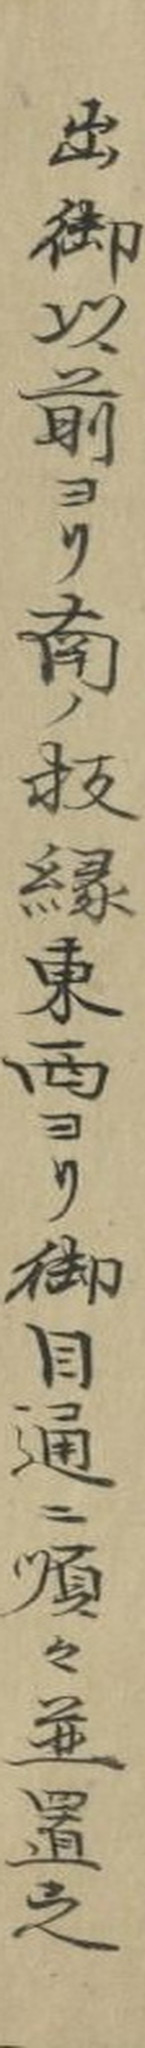出御以前ョㇼ南ノ板縁東西ョㇼ御目通ニ順々並置之
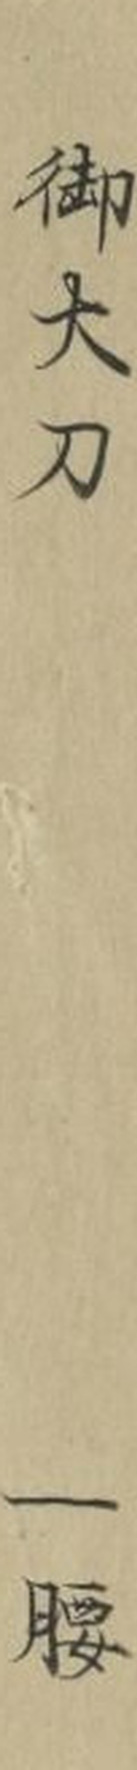御大刀一腰
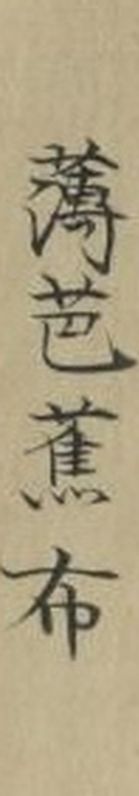薄芭蕉布同
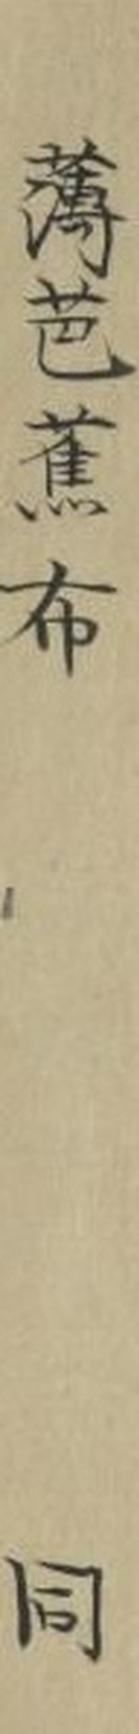薄芭蕉布同

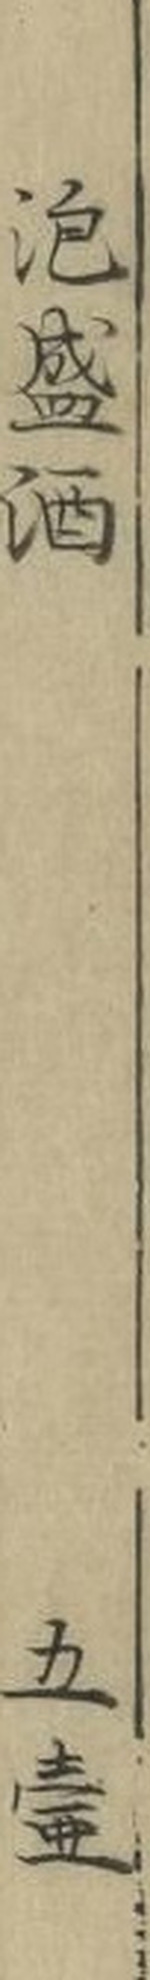泡盛酒五壺
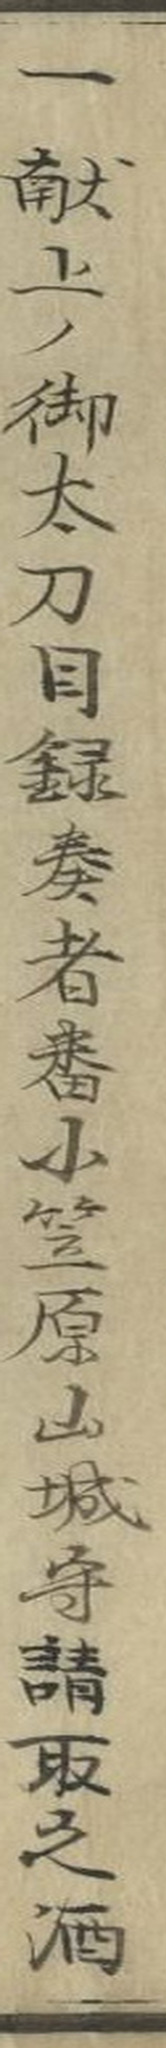一献上ノ御太刀目録奏者番小笠原山城守請取之酒
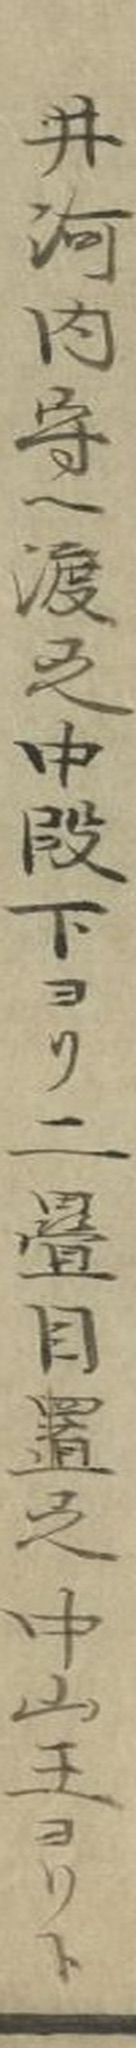井河内守へ渡之中段下ョㇼ二畳目之中山王ョㇼ下
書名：琉球往来（下）
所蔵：University of the Ryukyus Library
